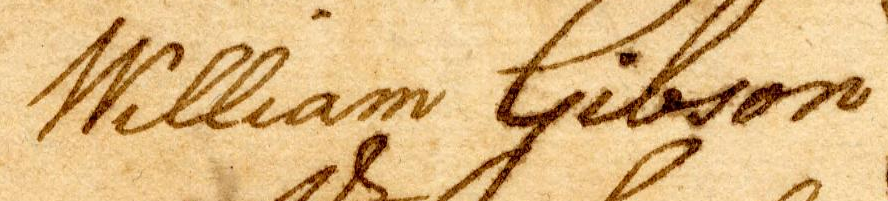William Gibson
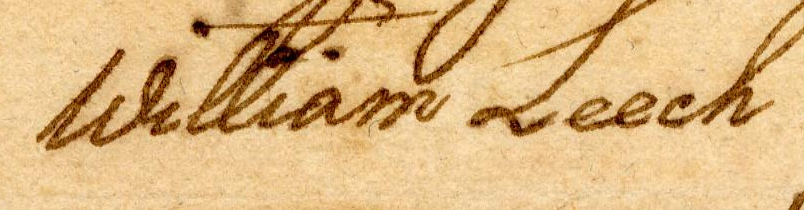William Leech
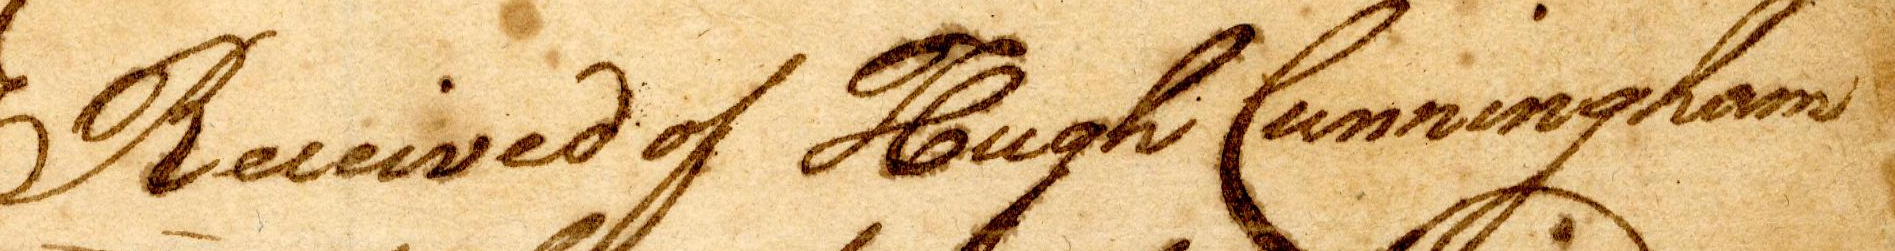Received of Hugh Cunningham
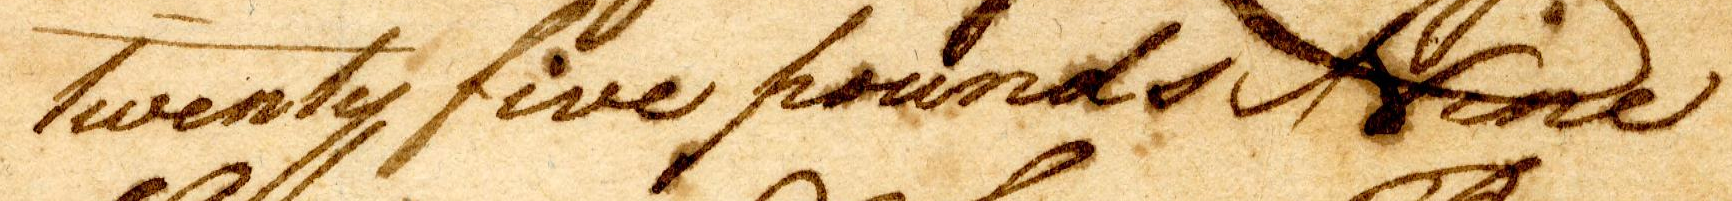Twenty five pounds Nine
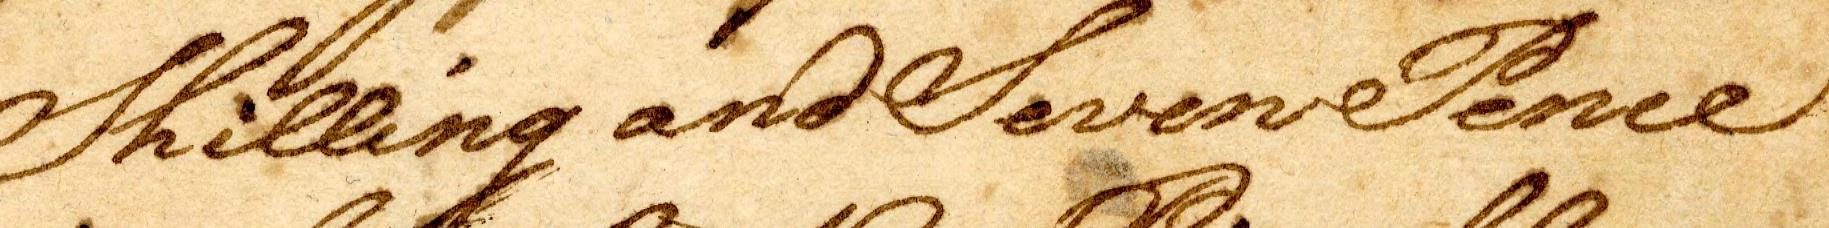Shilling and Seven Pence
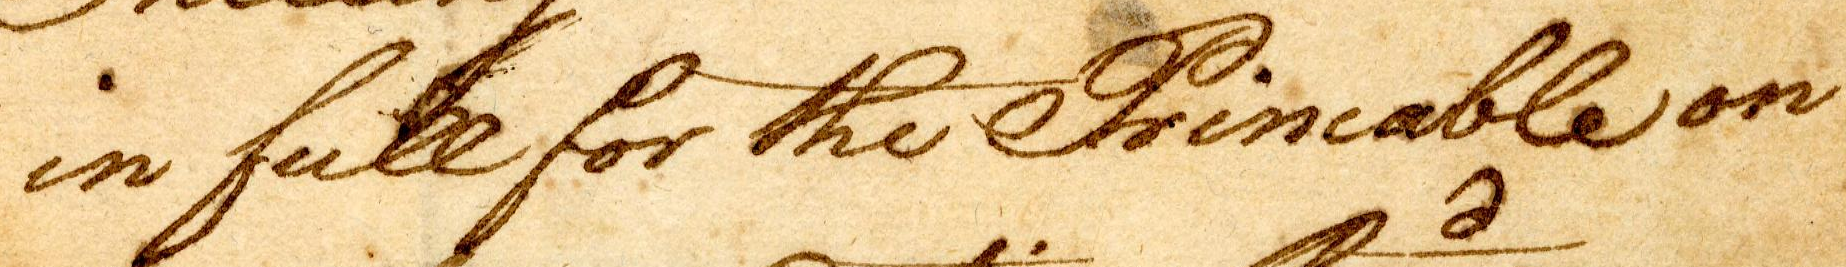in full for the Princable on
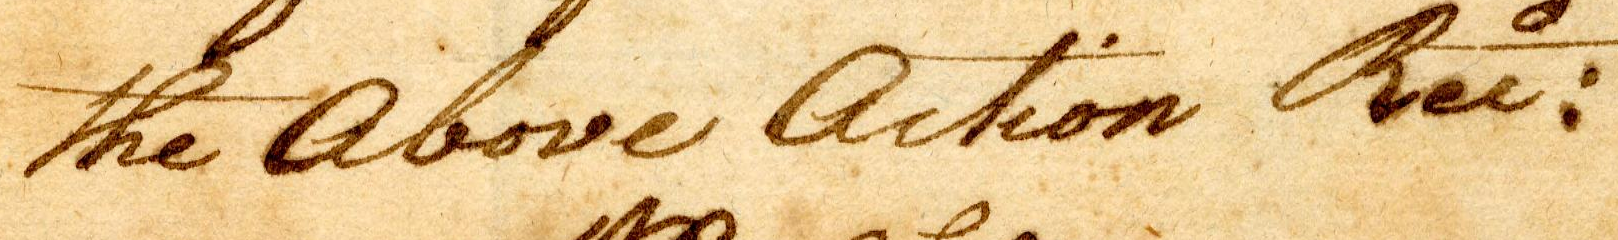The Above Action Rec^d:
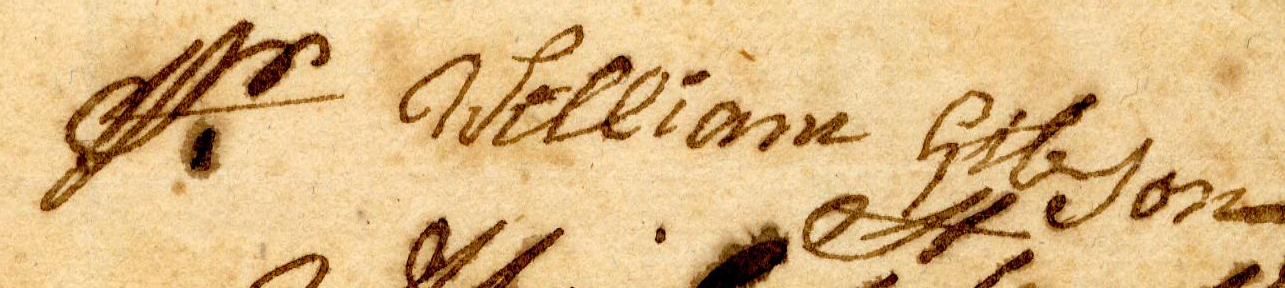per William Gibson
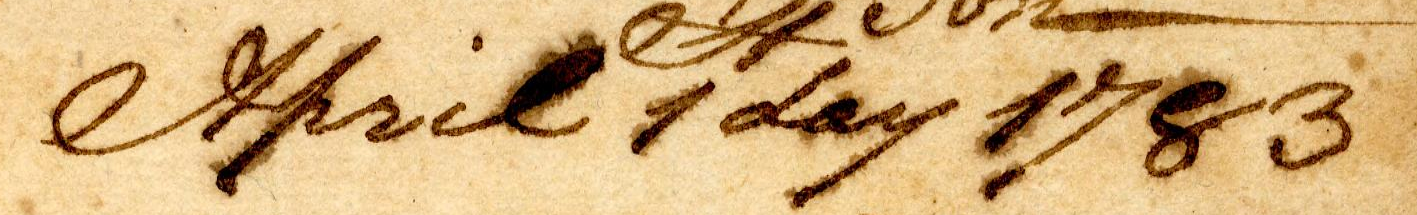April 1^st day 1783
